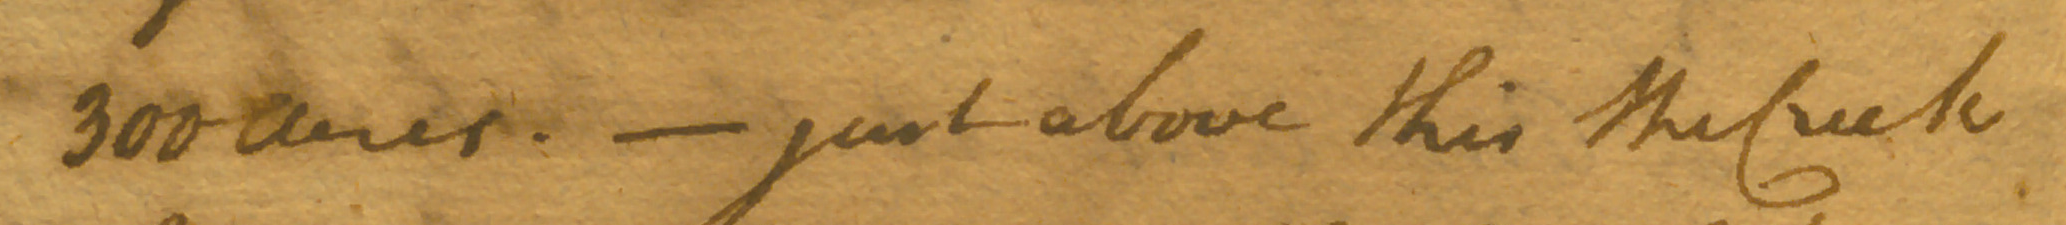300 acres.- just above this the Creek
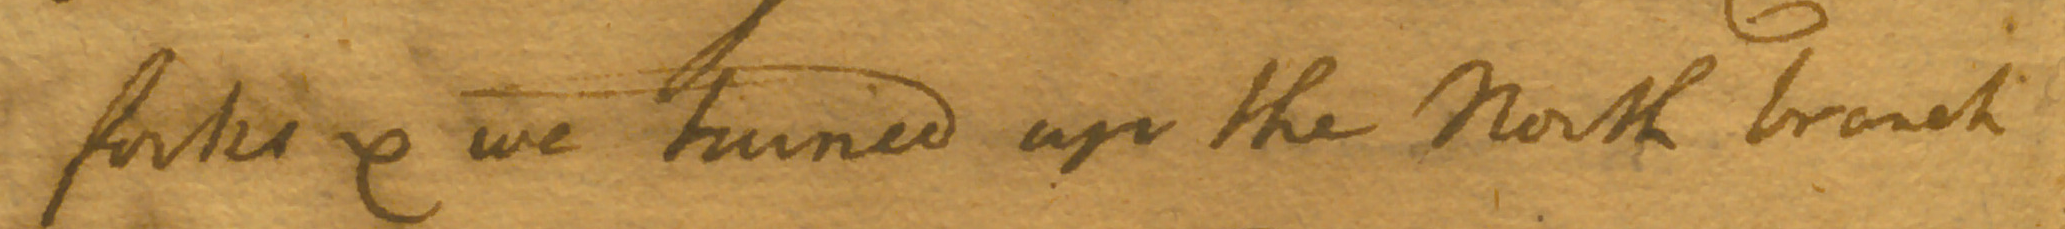forks & we turned up the North branch
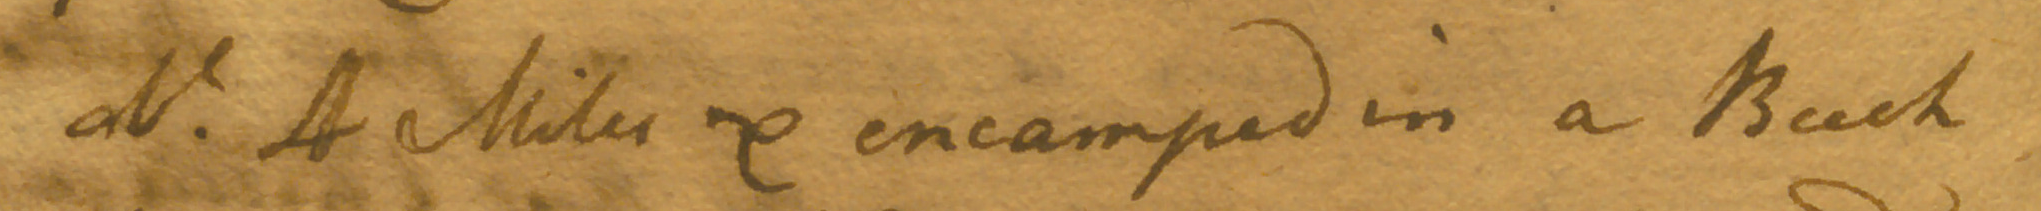ab^t. 4 Miles & encamped in a Beech
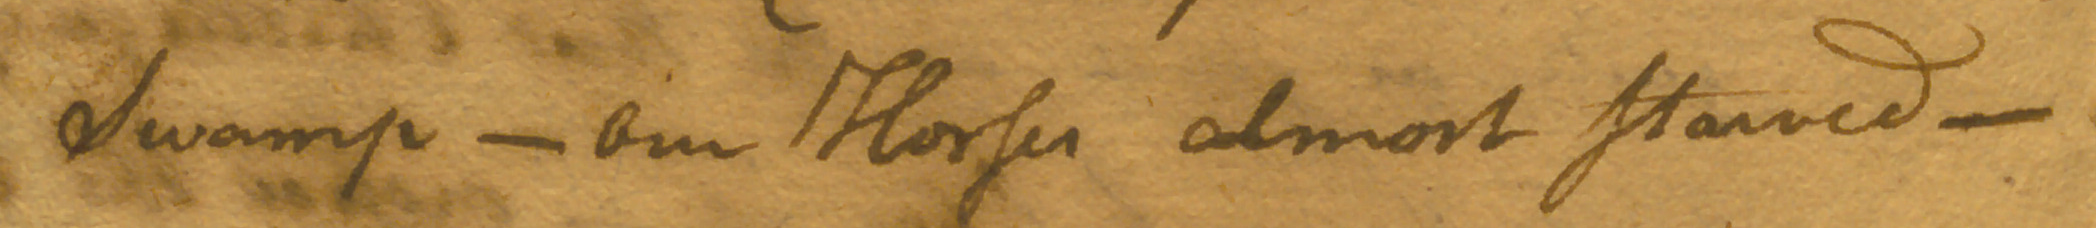Swamp- our Horses almost starved-
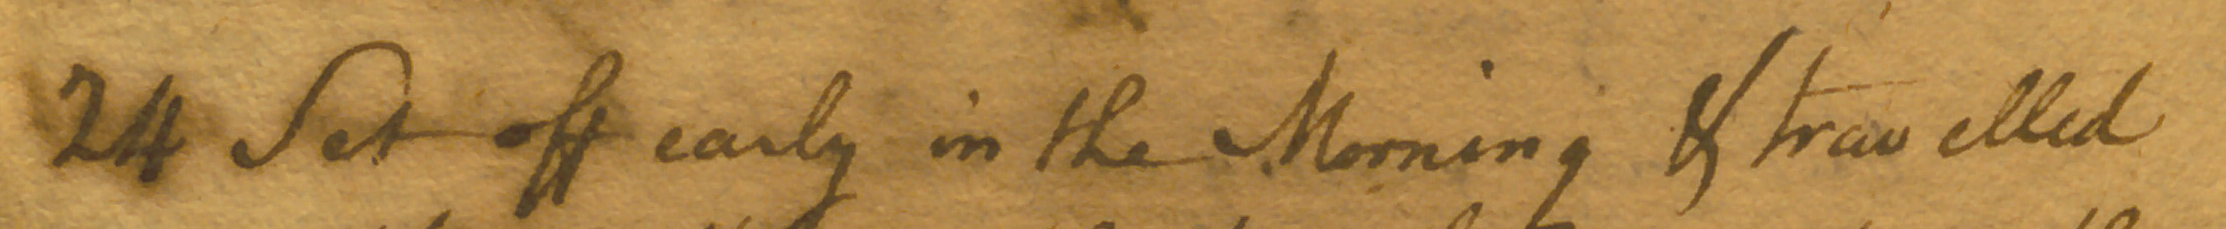24 Set off early in the Morning & travelled
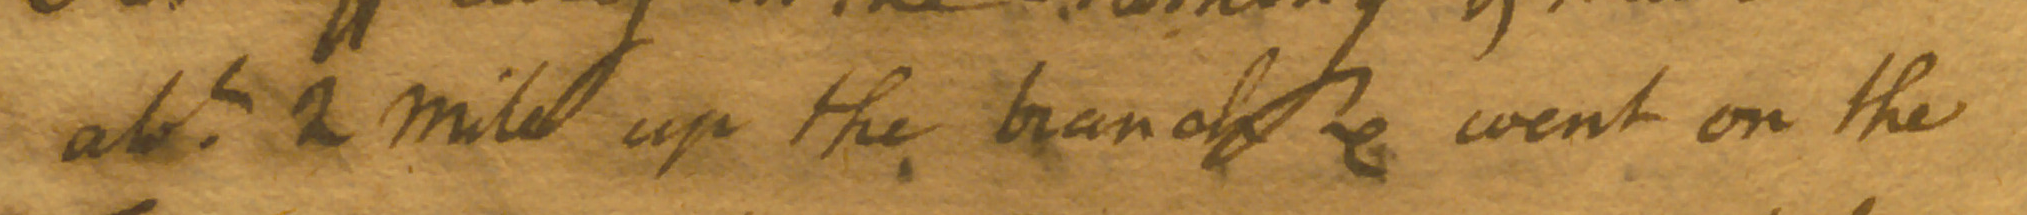ab^t. 2 mile up the branch & went on the
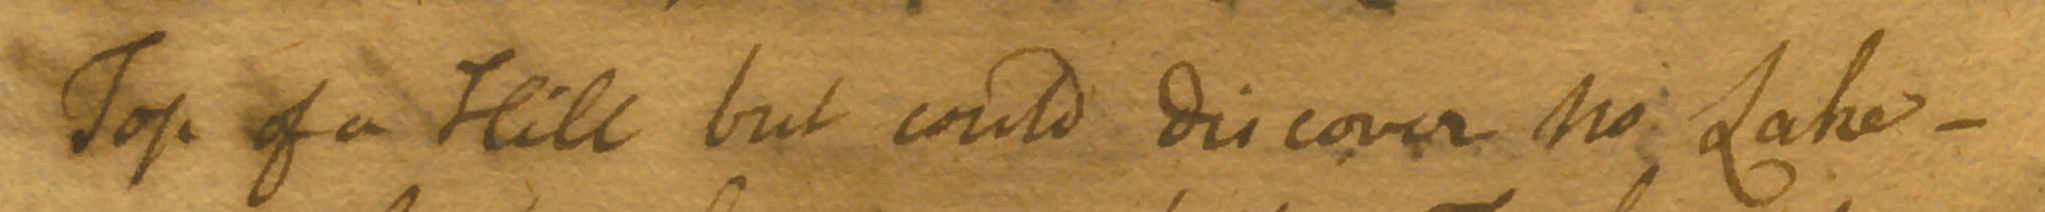Top of a Hill but could discover no Lake-
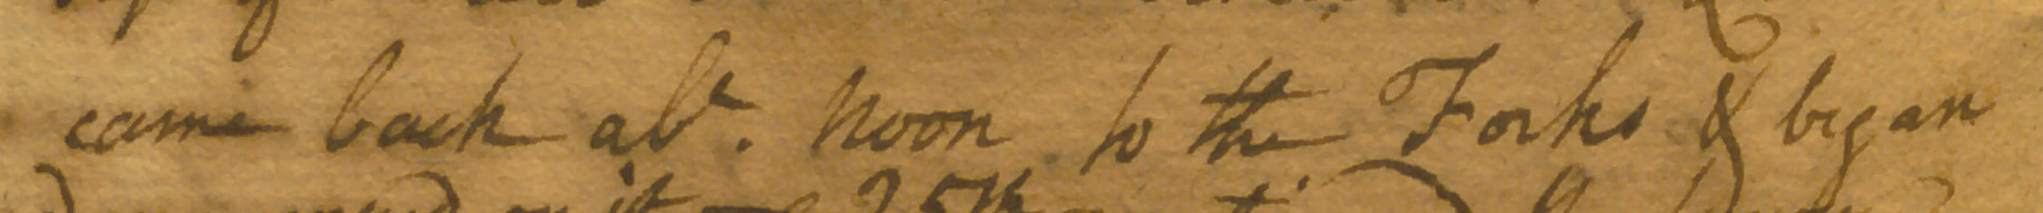came back ab^t. noon to the Forks & began
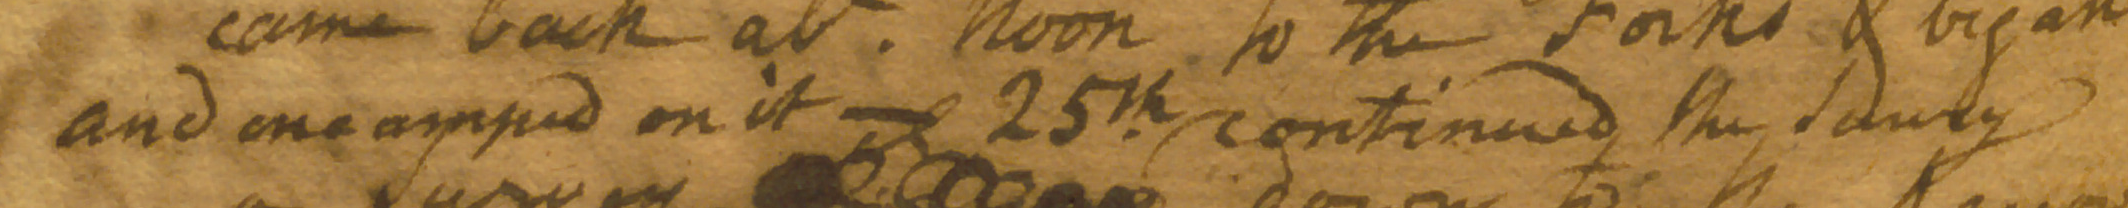and encamped on it- 25^th continued the Survey
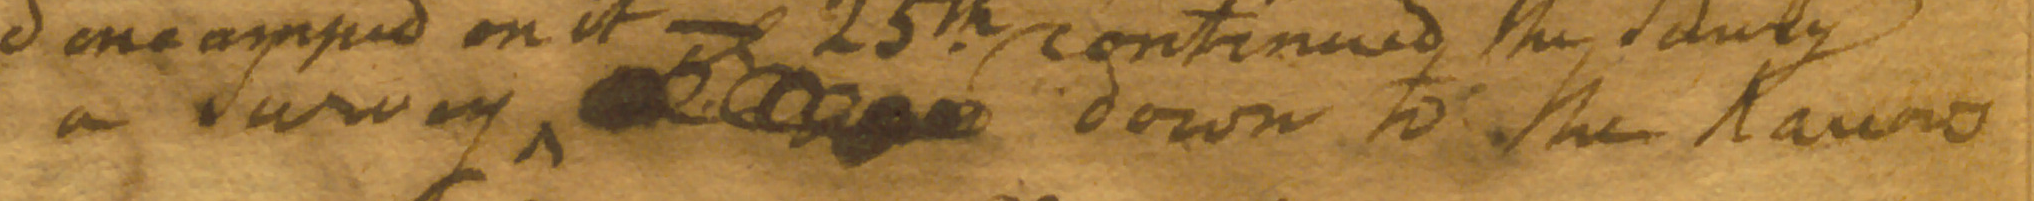a Survey ^ [______] down to the Kanows
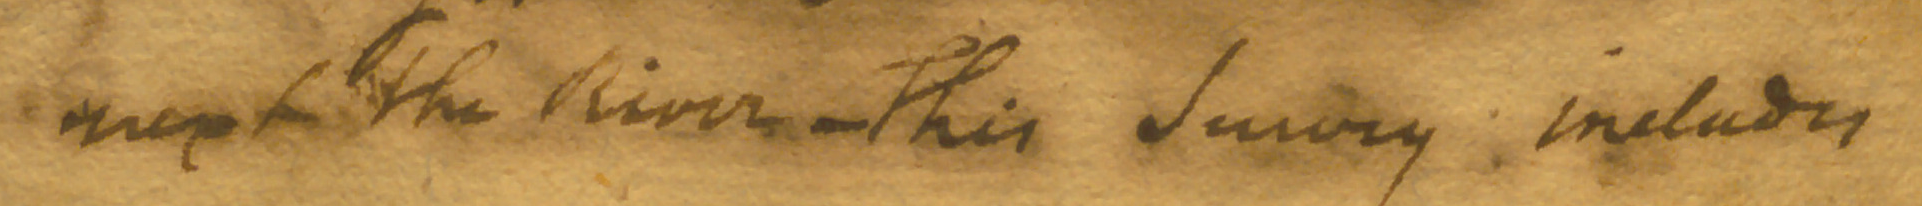next the River- This survey includes
